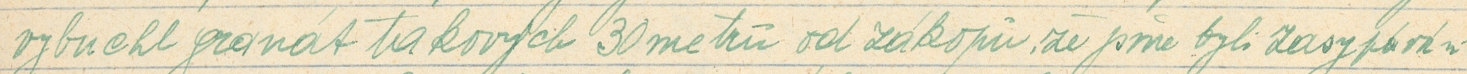vybuchl granát takových 30 metrů od zákopů, že jsme byli zasypáváni
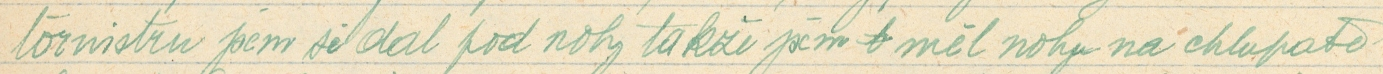tornistru jsem si dal pod nohy takže jsem měl nohy na chlupaté
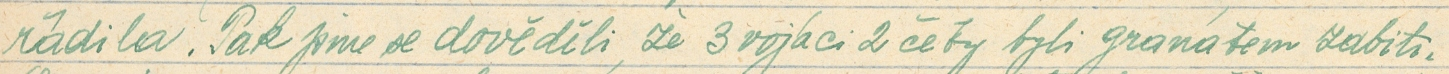řádila. Pak jsme se dověděli, že 3 vojáci 2 čety byli granátem zabiti.
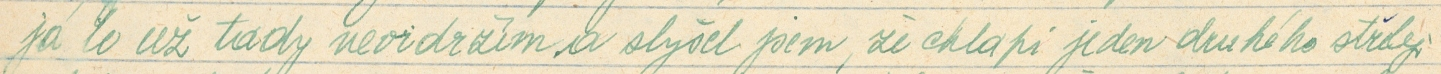já to už tady nevidržím a slyšel jsem, že chlapi jeden druhého střelej
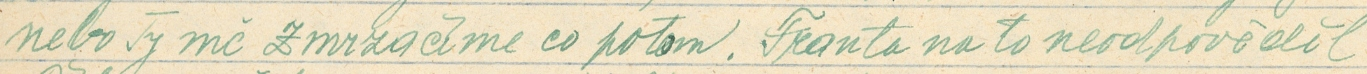nebo Ty mě zmrzačíme co potom. Franta na to neodpověděl.
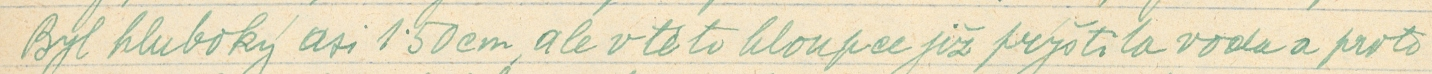Byl hluboký asi 1.50 cm, ale v této hloupce již prýštila voda a proto
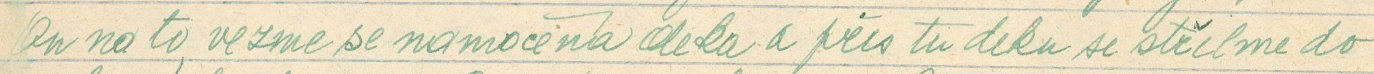On na to, vezme se namočená deka a přes tu deku se střelme do
